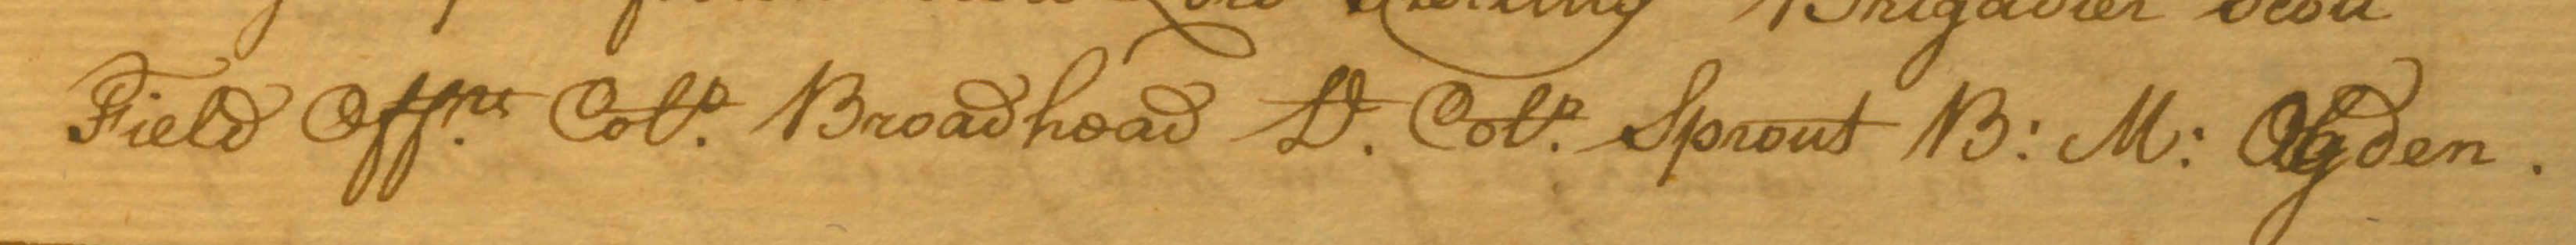Field Off^rs. Col^o. Broadhead L^t. Col^o. Sprout B: M: Ogden.
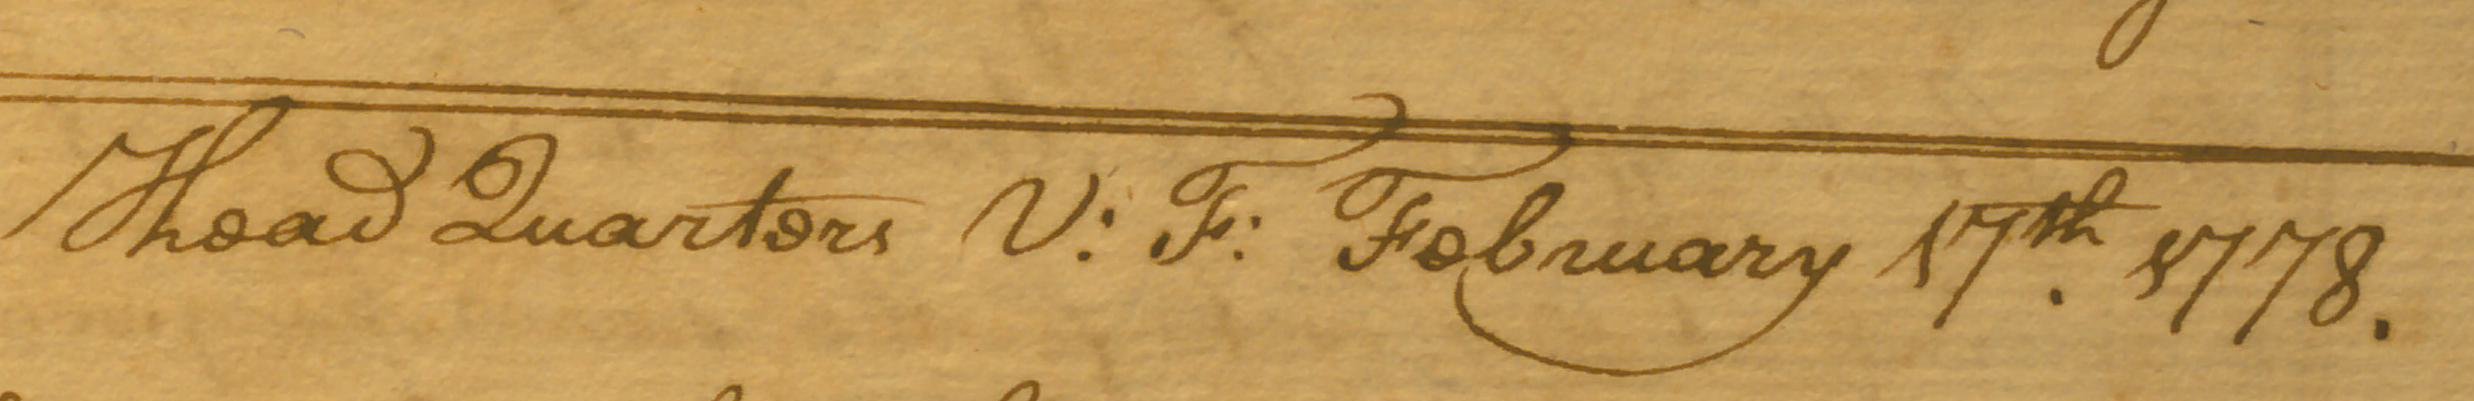Head Quarters V: F: February 17^th. 1778.
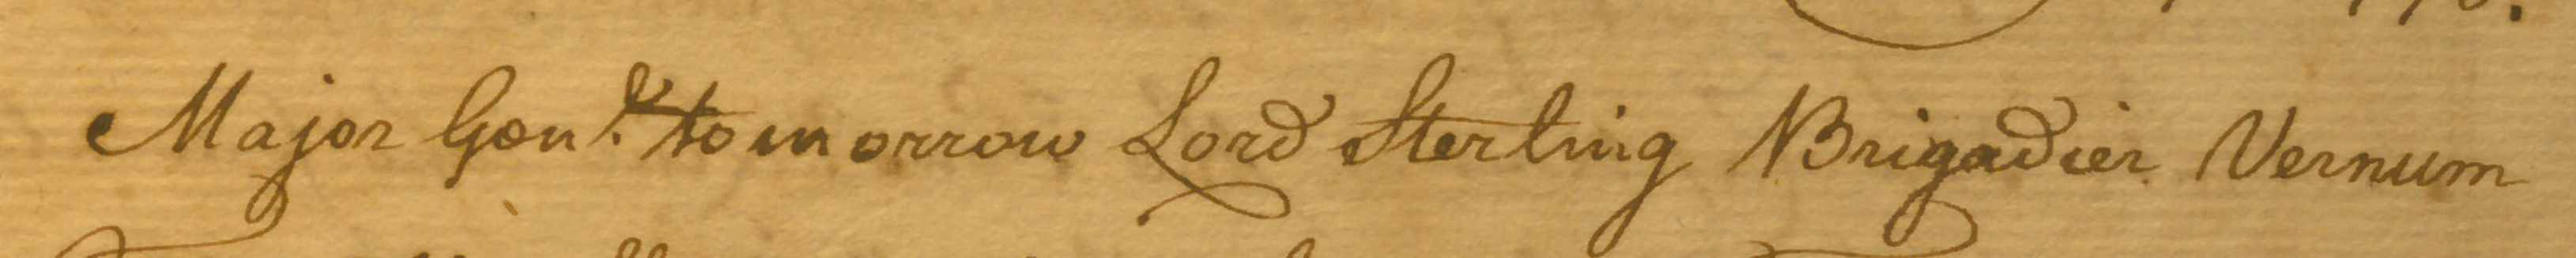Majory Gen^l. tomorrow Lord Sterling Brigadier Vernum
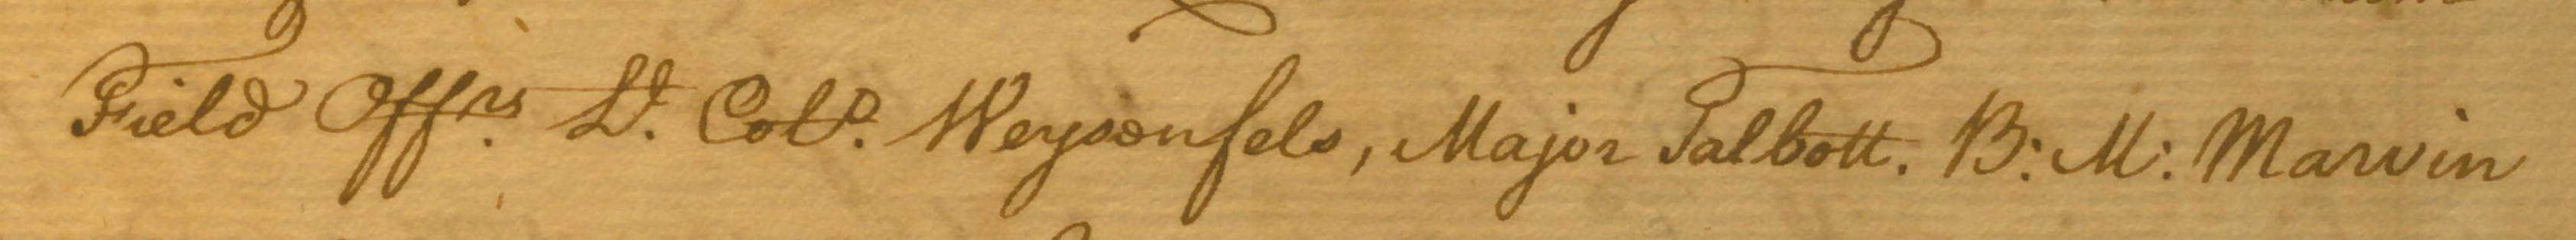Field Off^rs. L^t. Col^o. Weysenfels, Major Talbott. B: M: Marvin
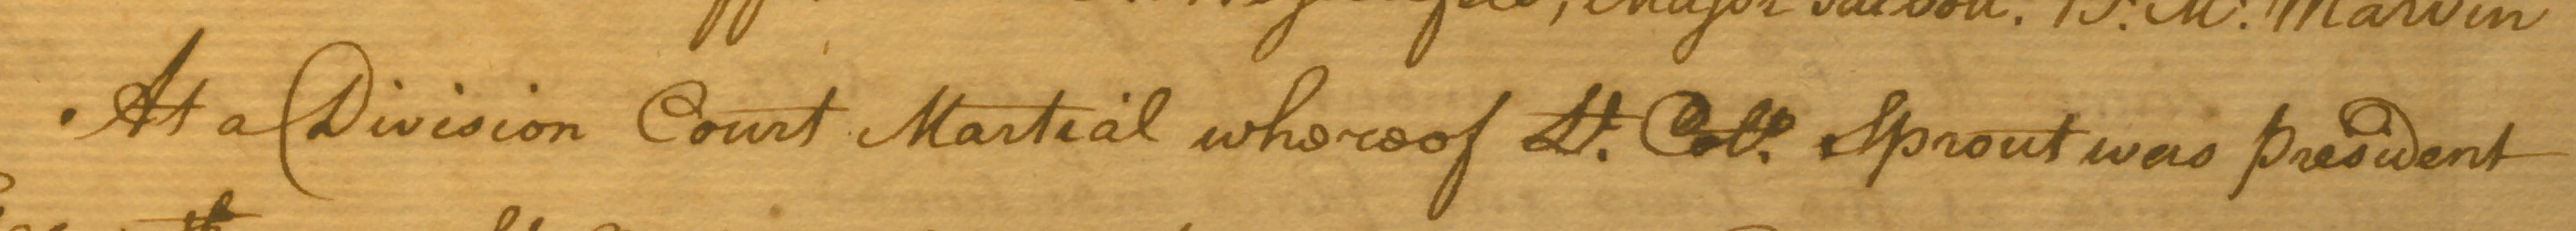At a Division Court Martial whereof L^t. Col^o. Sprout was president
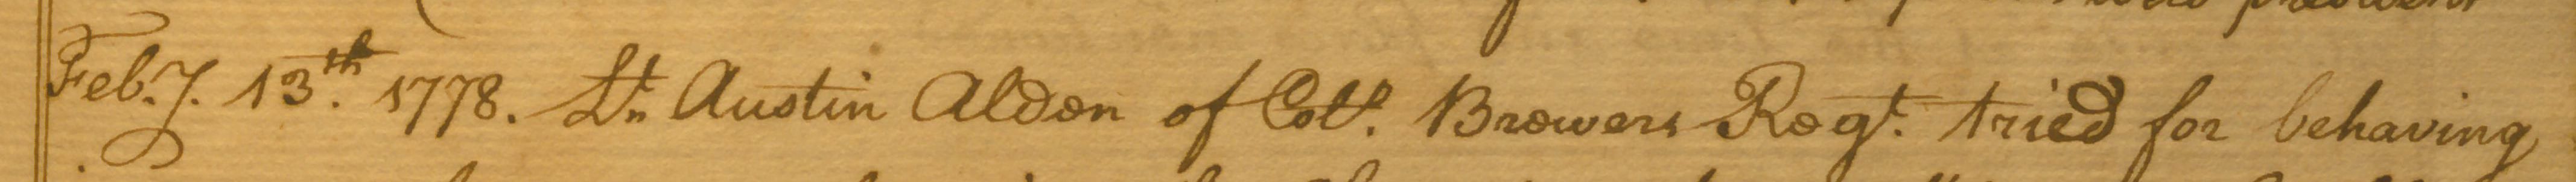Feb^y. 13^th. 1778. L^t. Austin Alden of Col^o. Browers Reg^t. tried for behaving
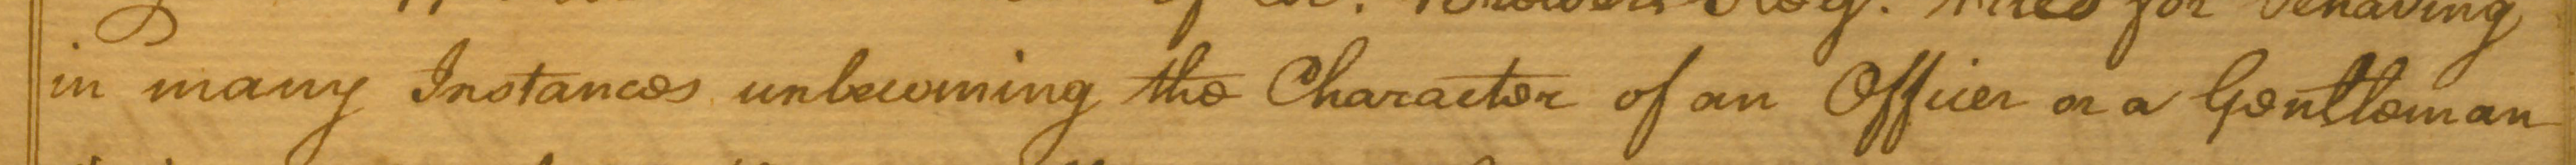in many Instances unbecoming the Character of an Officer or a Gentleman
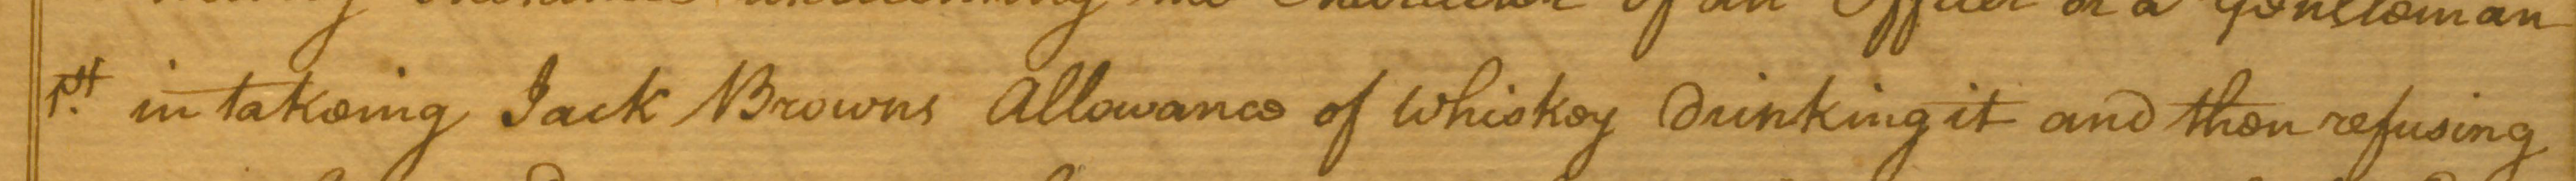1^st. in takeing Jack Browns allowance of Whiskey drinking it and then refusing
